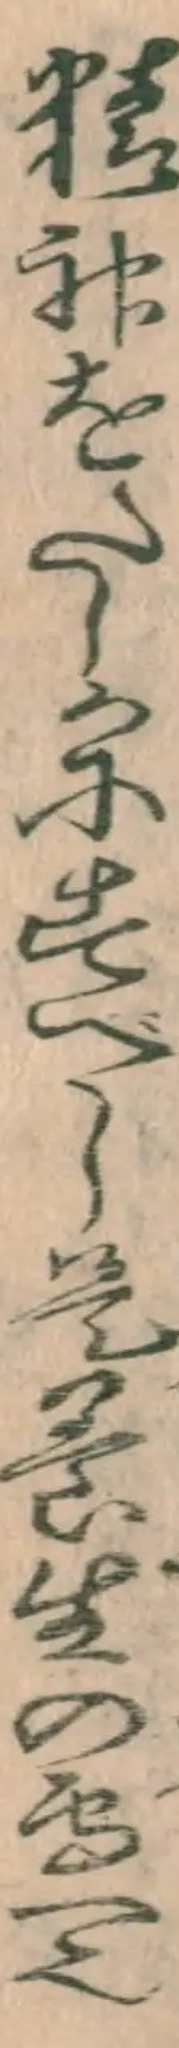精神をたしかにすべし是養生の専一也
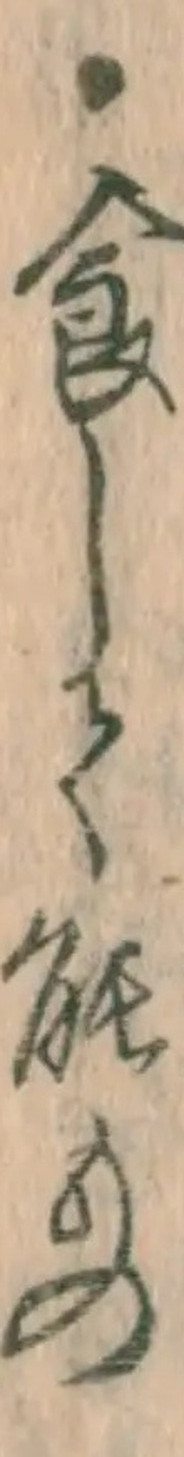・食して能もの
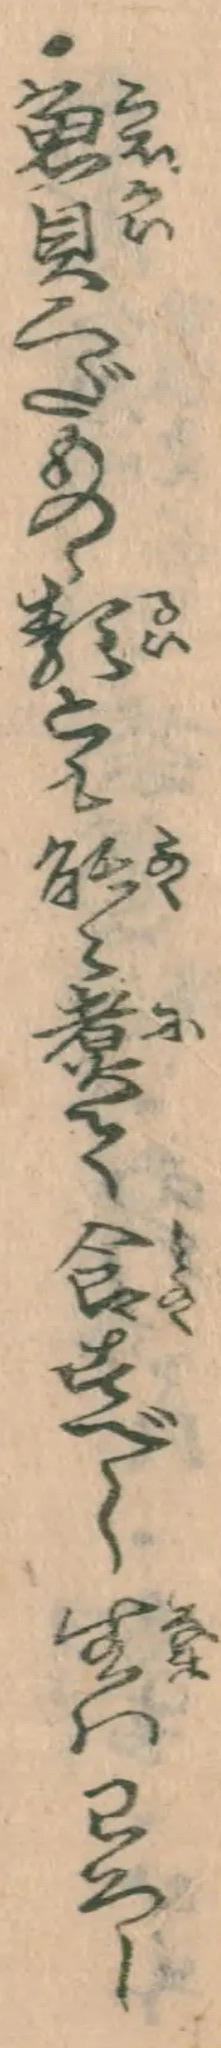・魚貝くだもの類とも能々煮て食すべし生はわろし
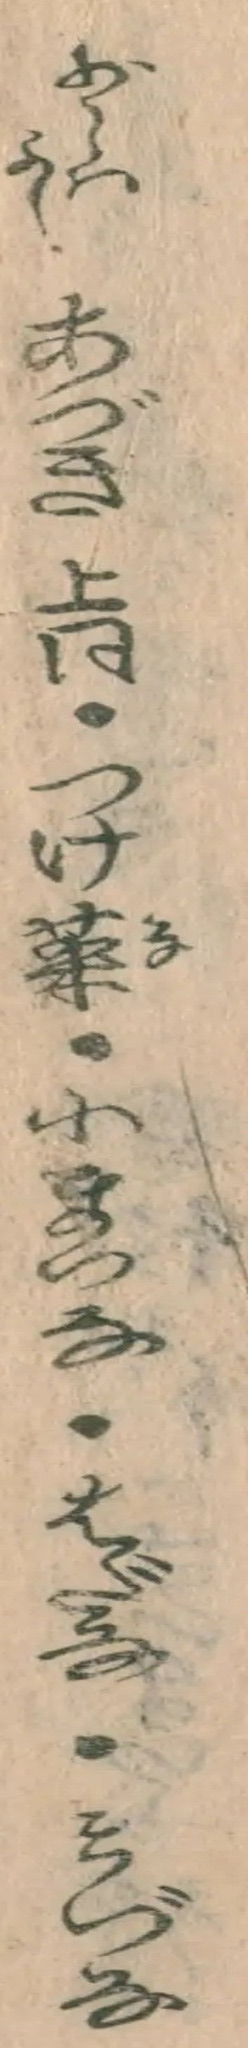少しはよしあづき上同・つけ菜・小まつな・はだな・みづな
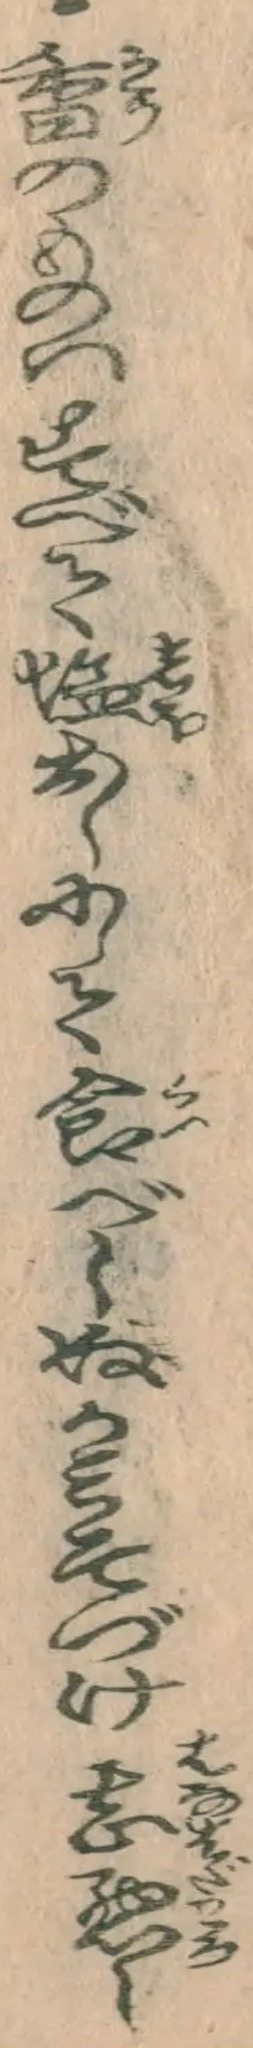・香のものはすべて塩おしにて食べしぬかみそづけ甚悪し

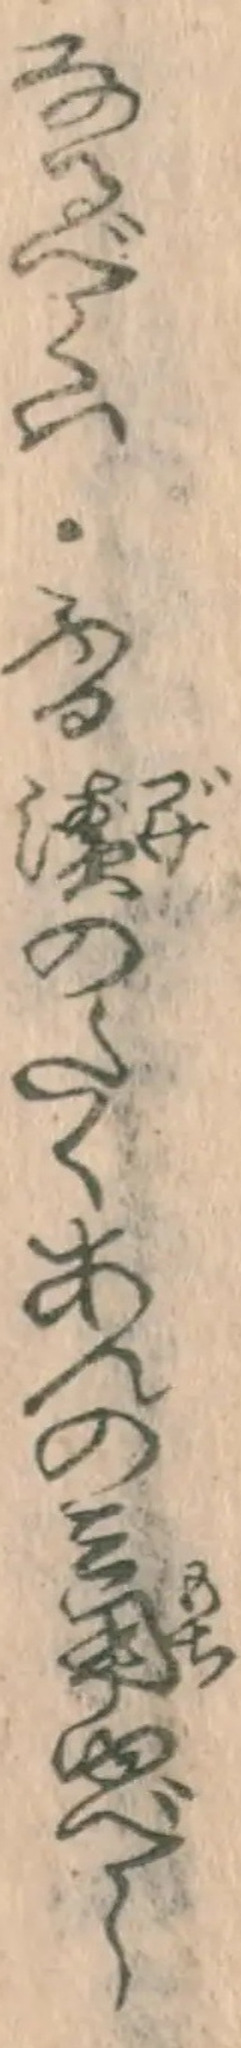なるべくは・ふる漬のたくあんのみ用ゆべし
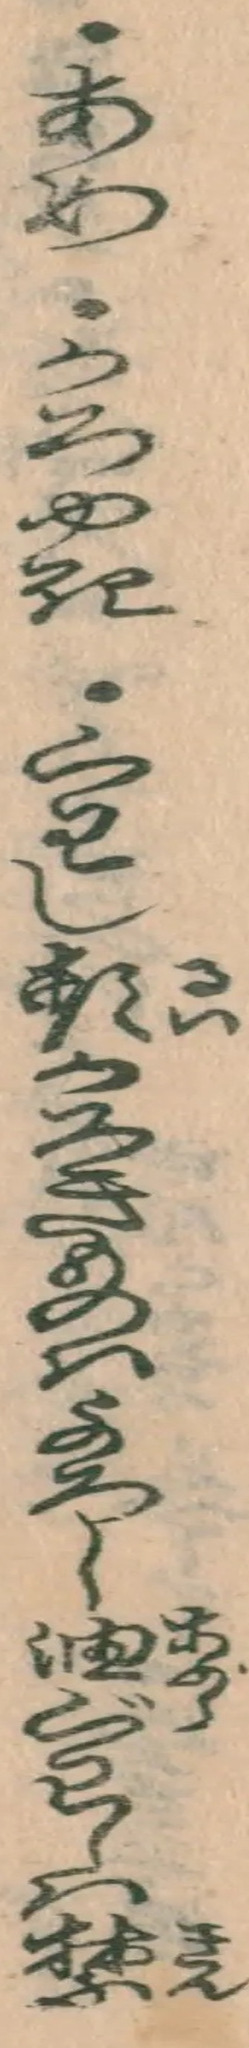・あめ・かろゆき・くわし類かろきものはよろし油ぐわしは禁
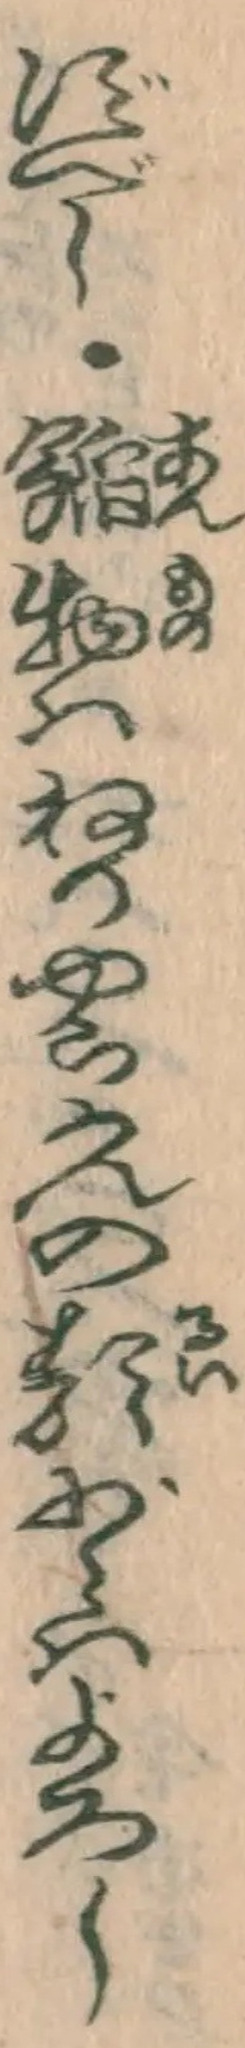ずべし・餡物はねりやうかんの類少しはよろし
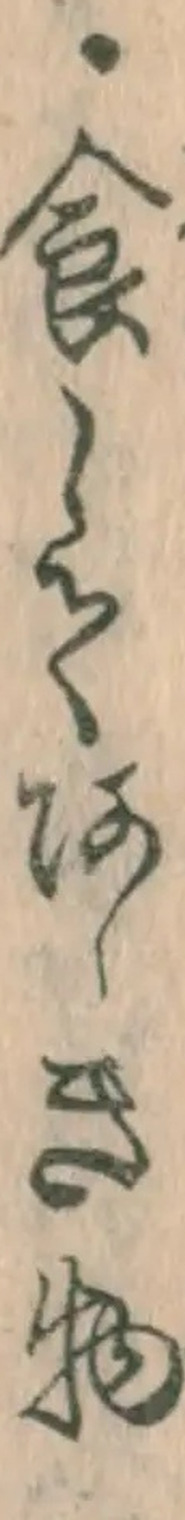・食してあしき物
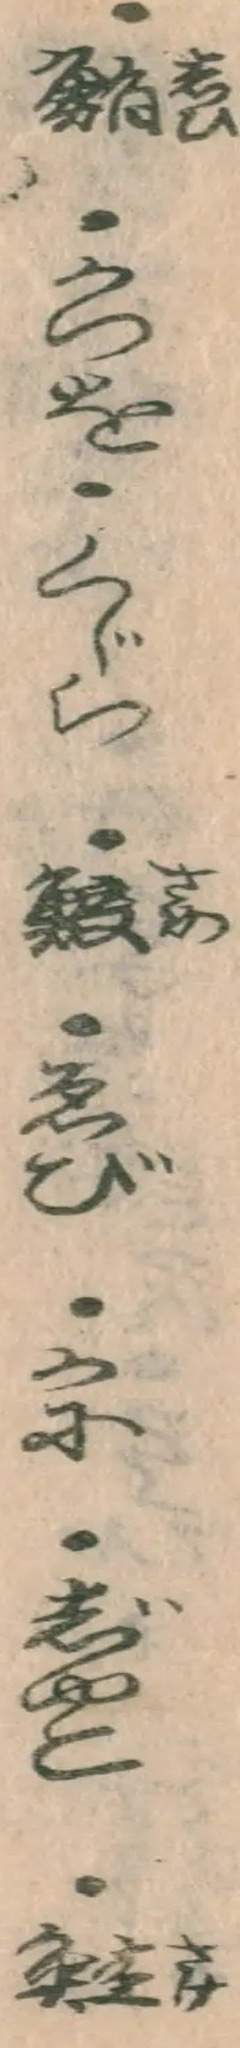・鮪・かつを・くじら・鮫・ゑび・かに・じやこ・鮭
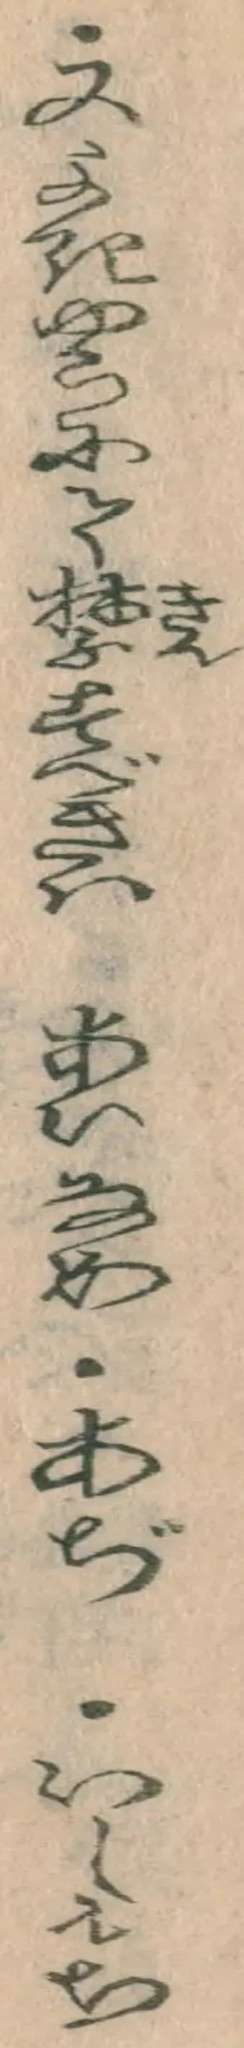・又よきやうにて禁すべきはあいなめ・あぢ・いしもち

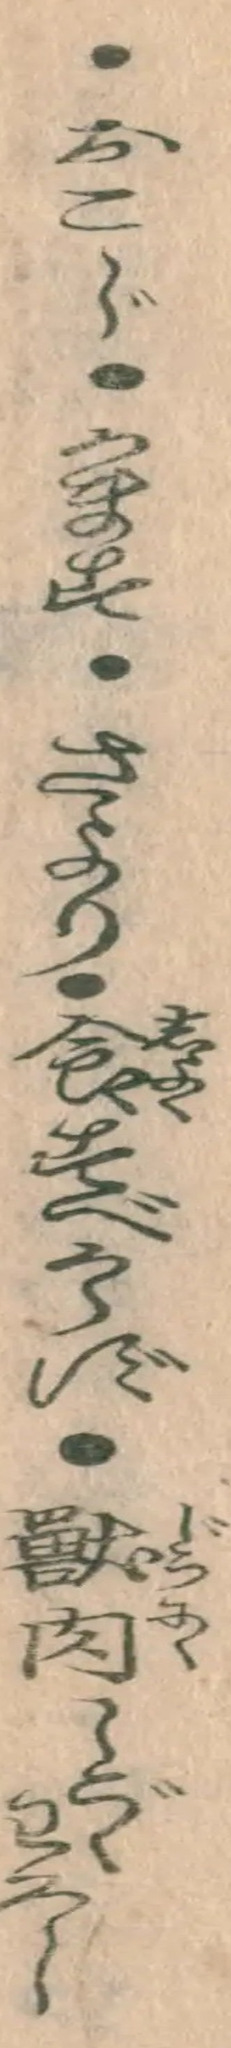・おこじ・かます・さより・食すべからず・獣肉しごくわろし
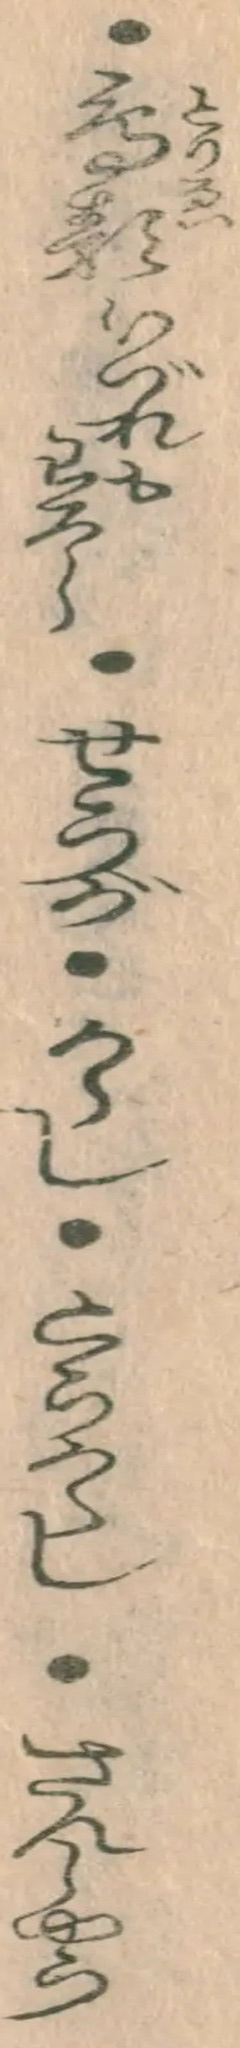・鳥類いづれもわろし・せうが・からし・とうからし・さんしやう
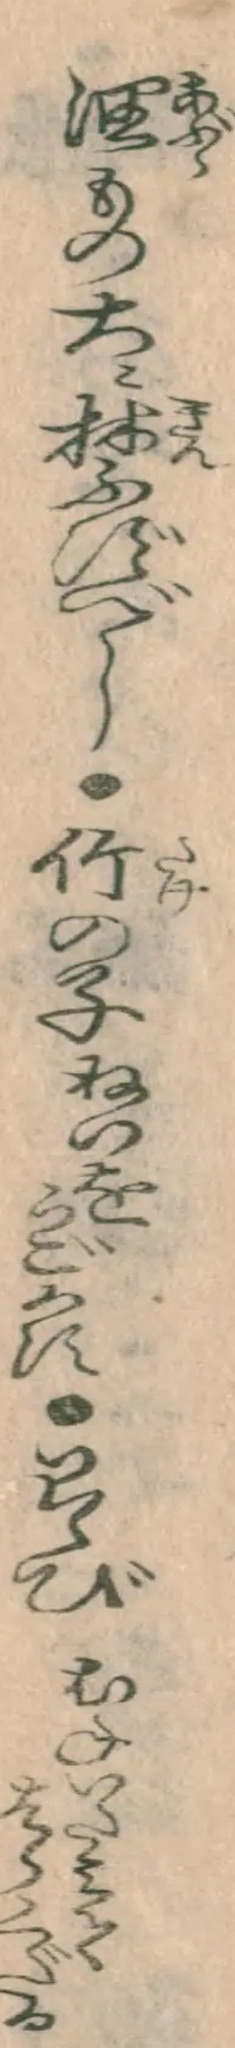油もの大に禁ずべし・竹の子ねつをうごかす・わらびむねいたみてはらくだる
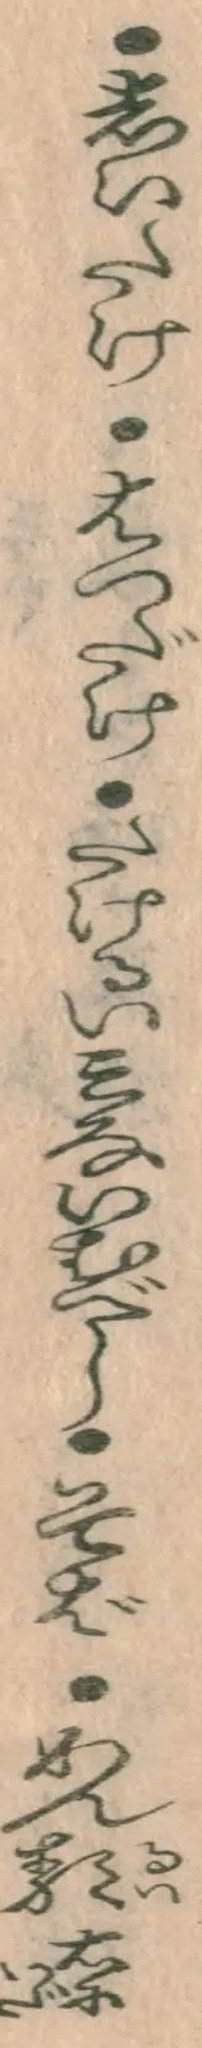・しいたけ・はつだけ・たけるいみないむべし・そば・めん類右にいだ
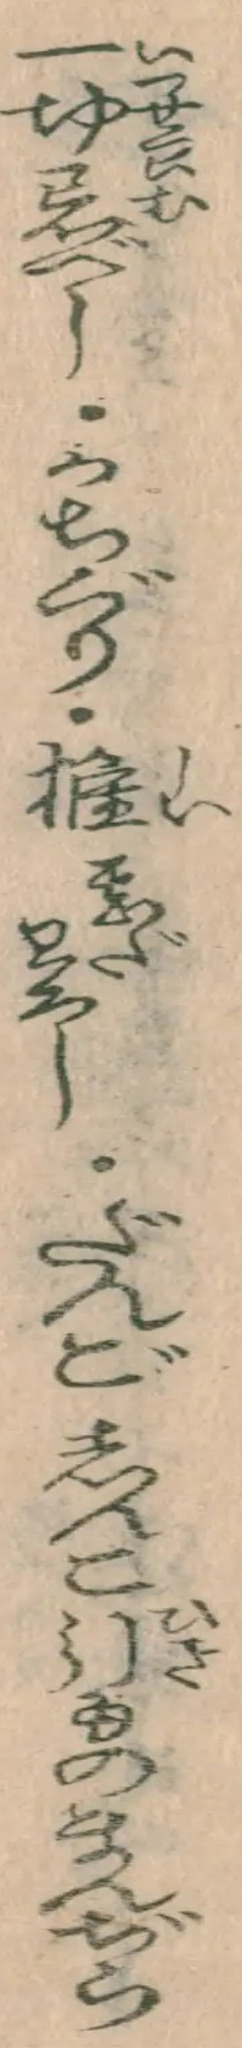一切忌べし・かちぐり・椎甚だわろし・だんごしんこ引ものまんぢう
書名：麻疹養生鑑
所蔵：国立国会図書館 National Diet Library, JAPAN
